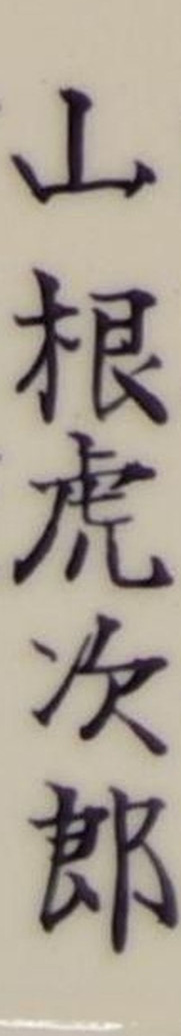山根虎次郎
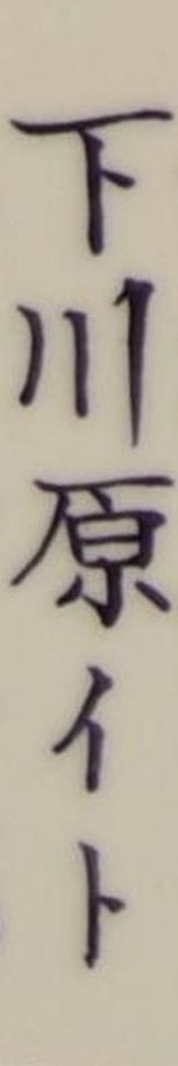下川原イト
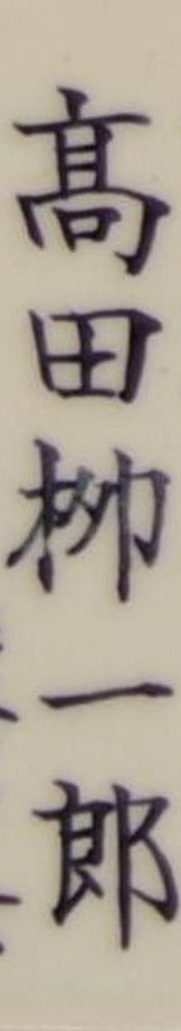高田柳一郎

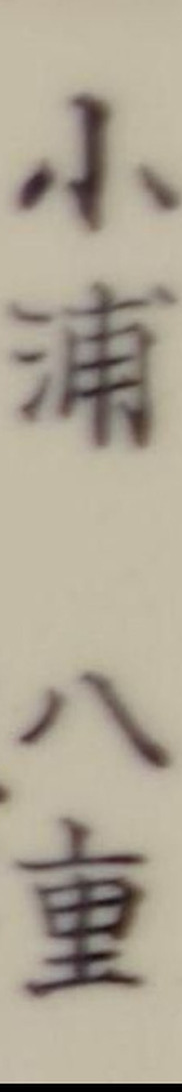小浦八重
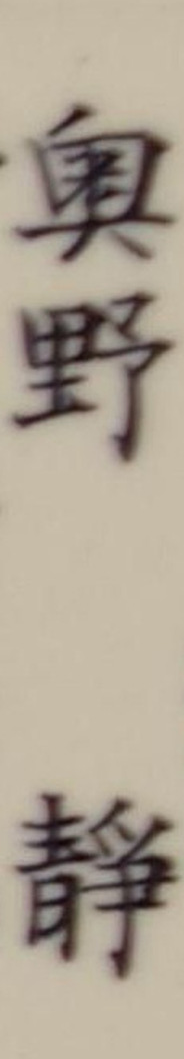奥野静
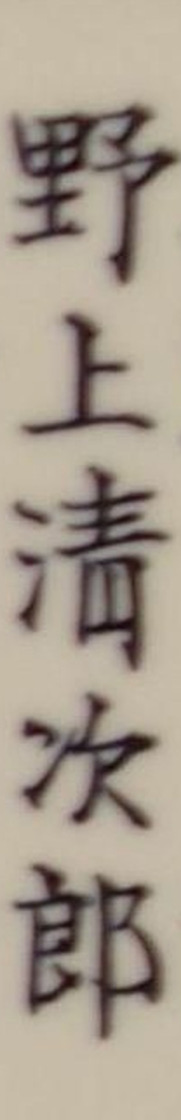野上清次郎
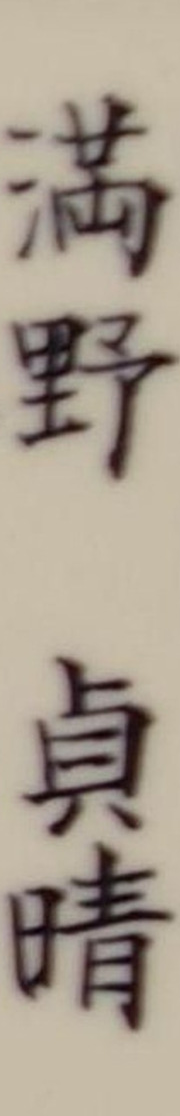滿野貞晴
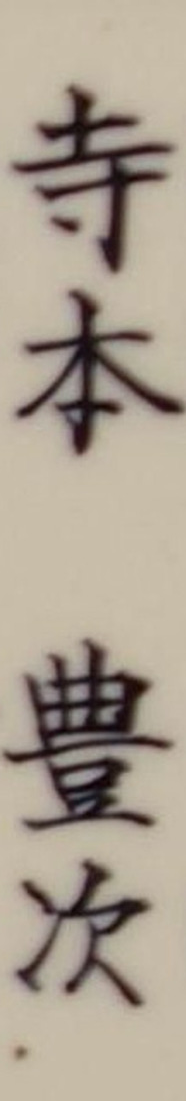寺本豊次
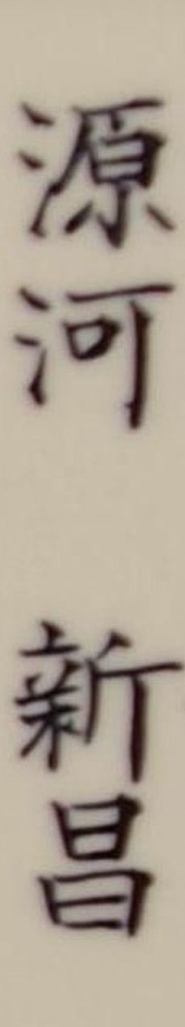源河新昌
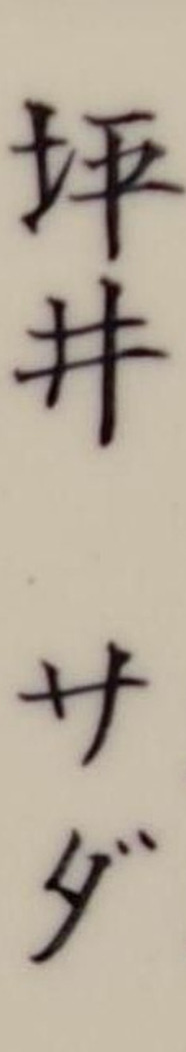坪井サダ
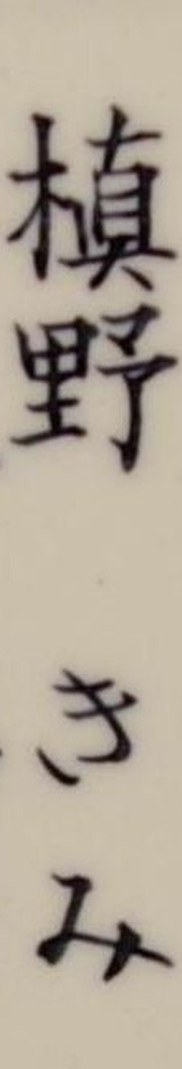槙野きみ
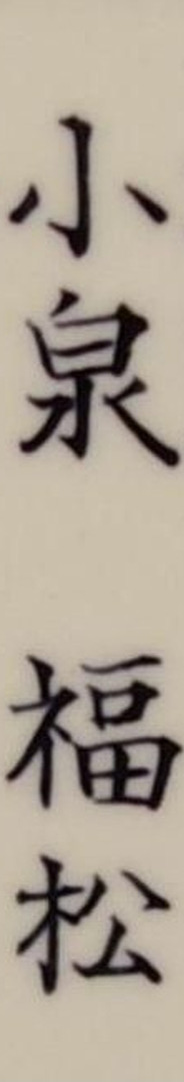小泉福松
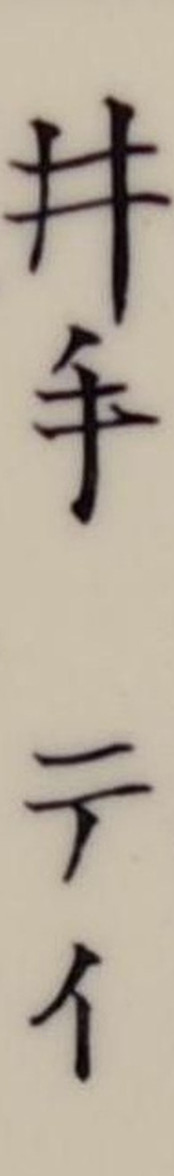井手テイ
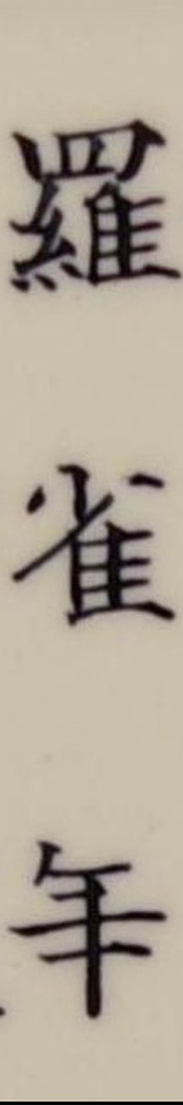羅雀年
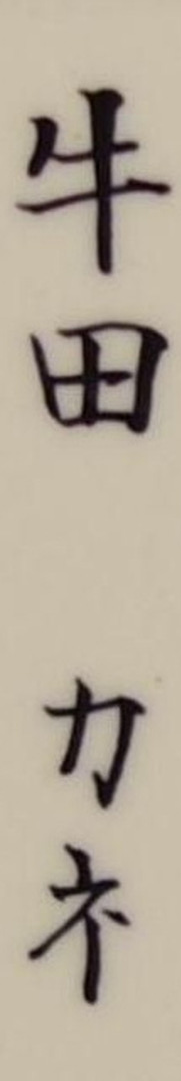牛田カネ
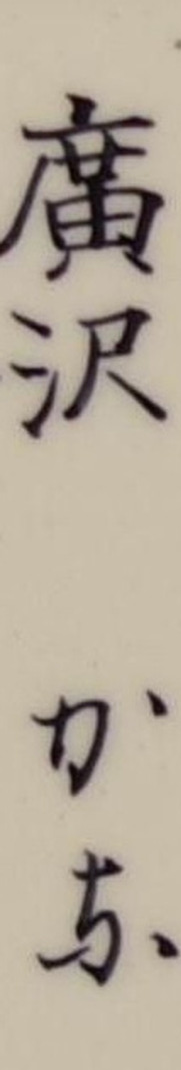廣沢かな
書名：M~S
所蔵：高野山金剛峯寺
